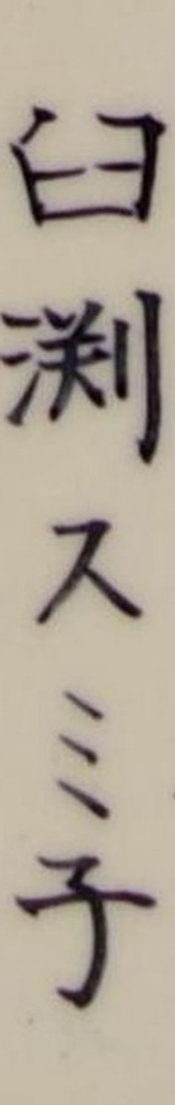臼渕スミ子
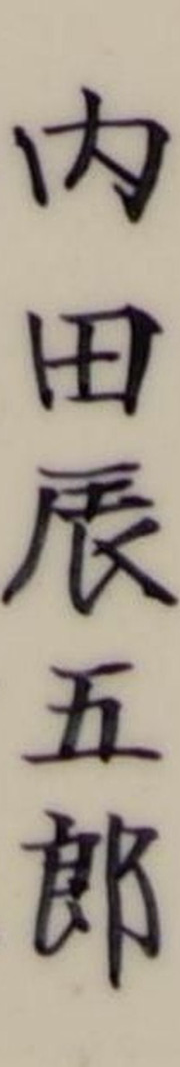内田辰五郎
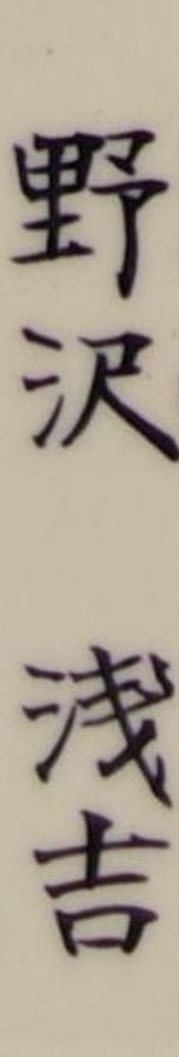野沢浅吉
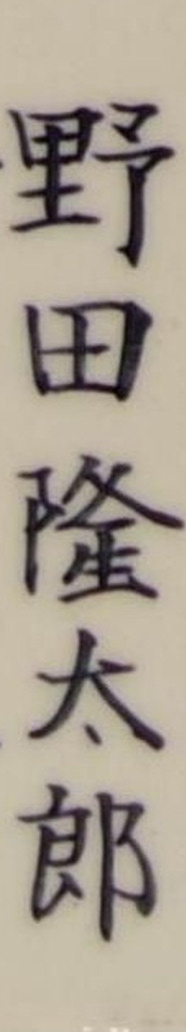野田隆太郎
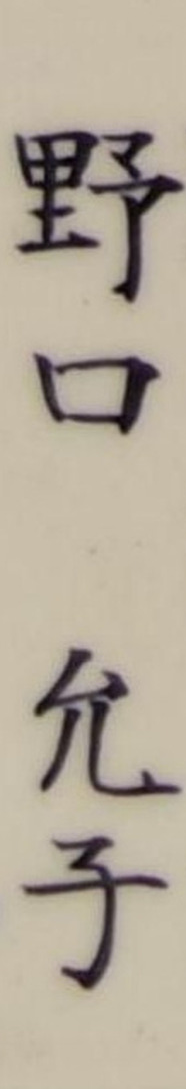野口允子
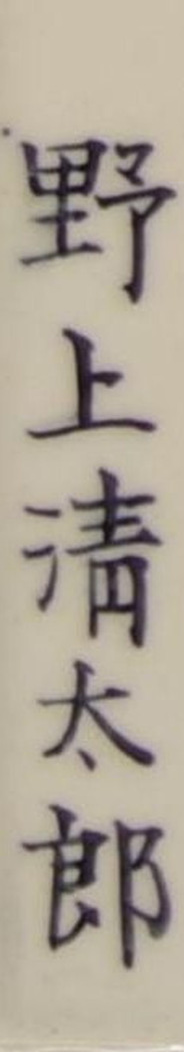野上清太郎

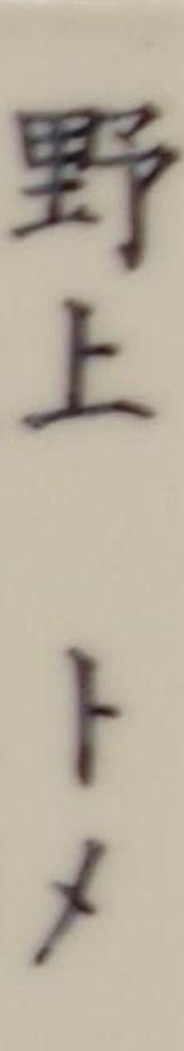野上トメ
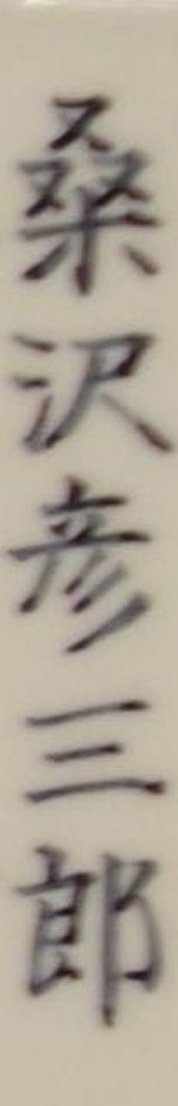桑沢彦三郎
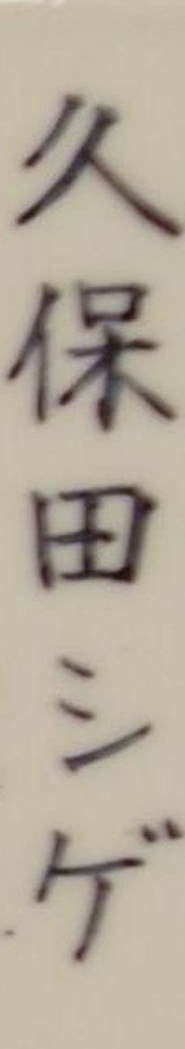久保田シゲ
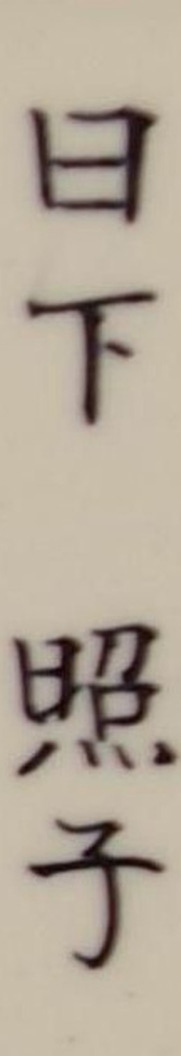日下照子
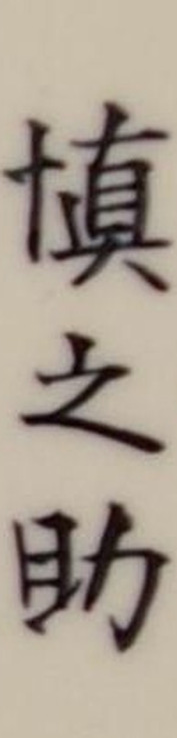慎之助
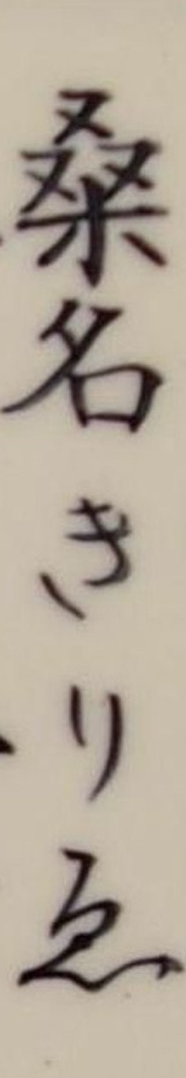桑名きりゑ
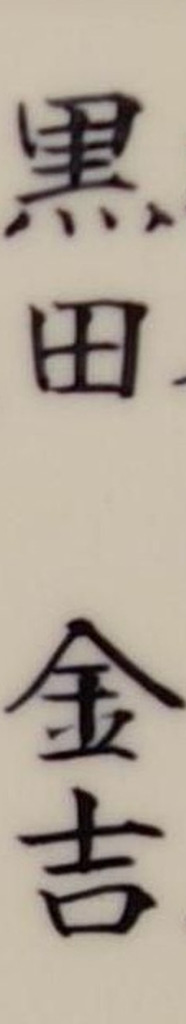黒田金吉
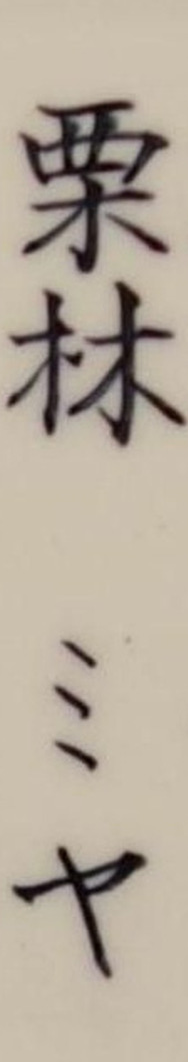栗林ミヤ
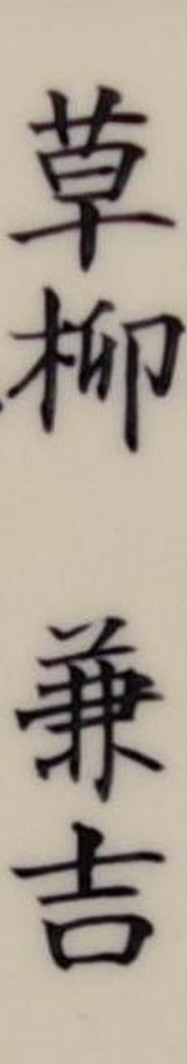草柳兼吉
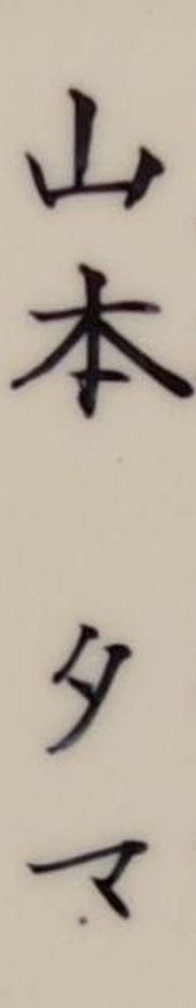山本タマ
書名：M~S
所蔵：高野山金剛峯寺
